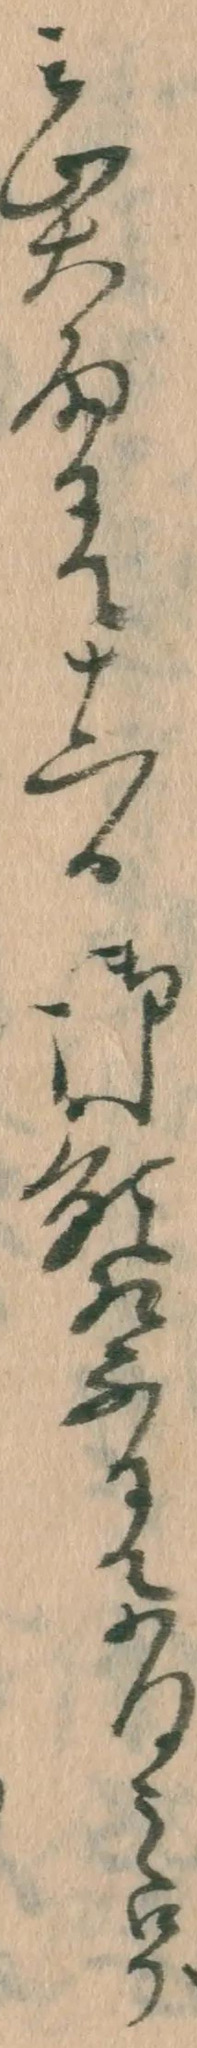甚大雨にて十二日御顕察にて有之候が
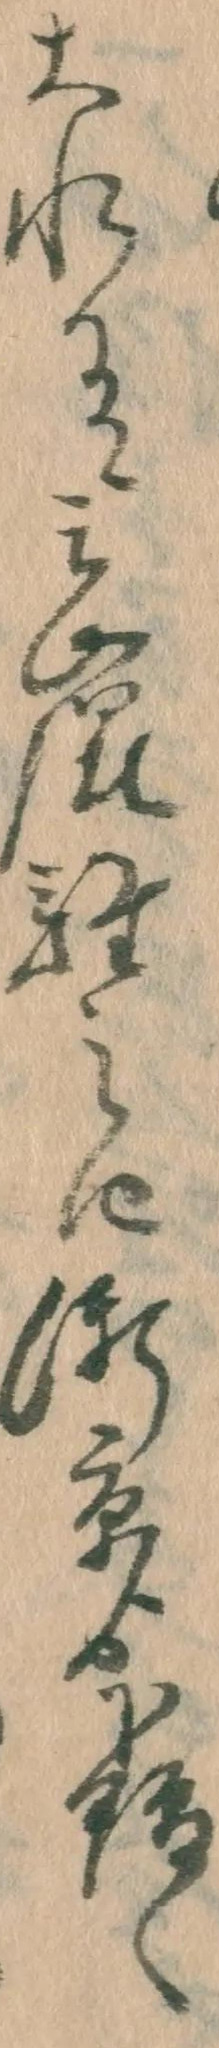大水にて甚混雑之由漸京ゟ下鴨へ
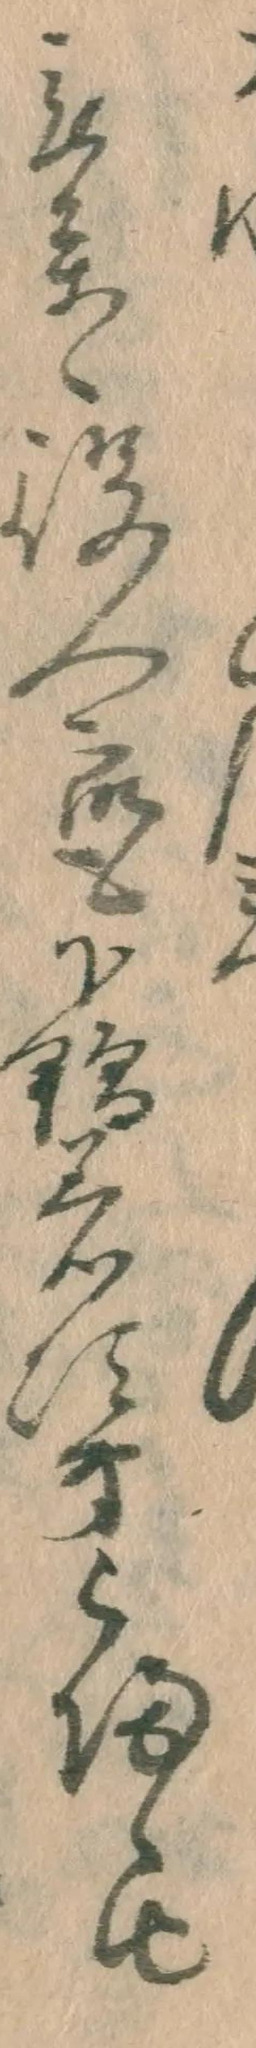被参候役人衆も下鴨着次第被帰候由
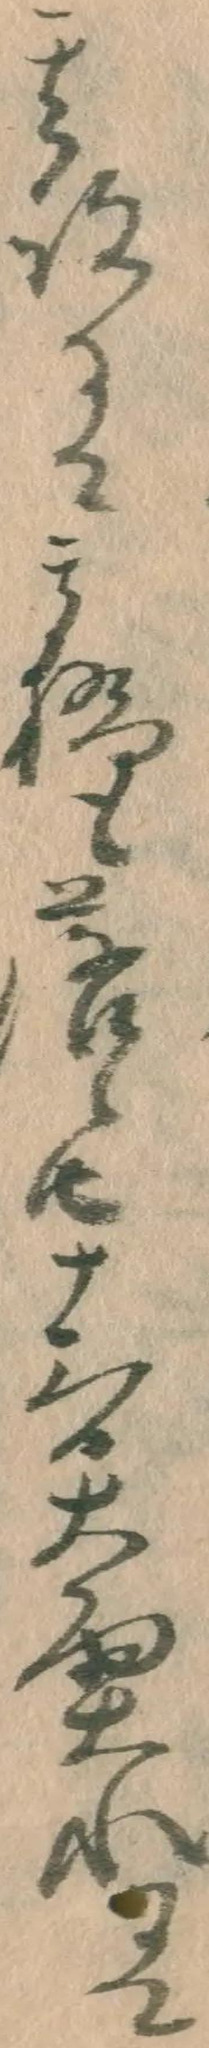其役にて其橋も落候由十三日大雨大水にて

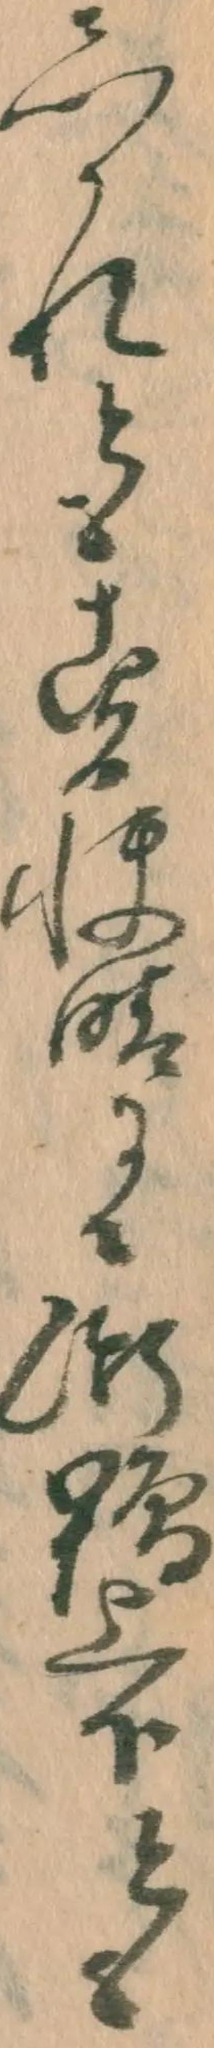しかれとも十四日快晴にて漸鴨上下とも
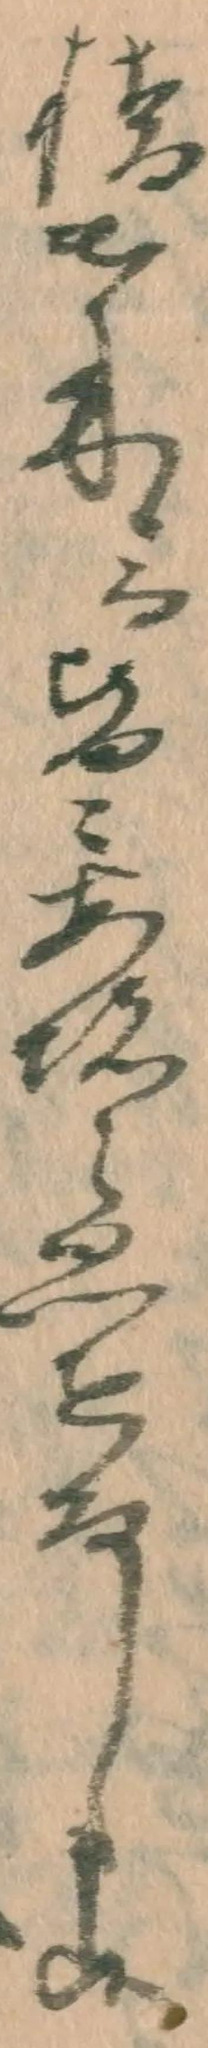橋出来候而皆々安堵之思をなし申候
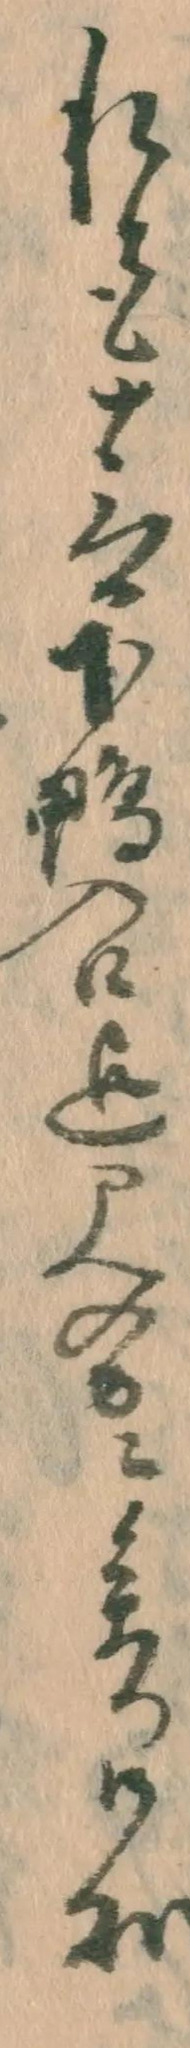私とも十三日下鴨入口迄見分ニ参り候処
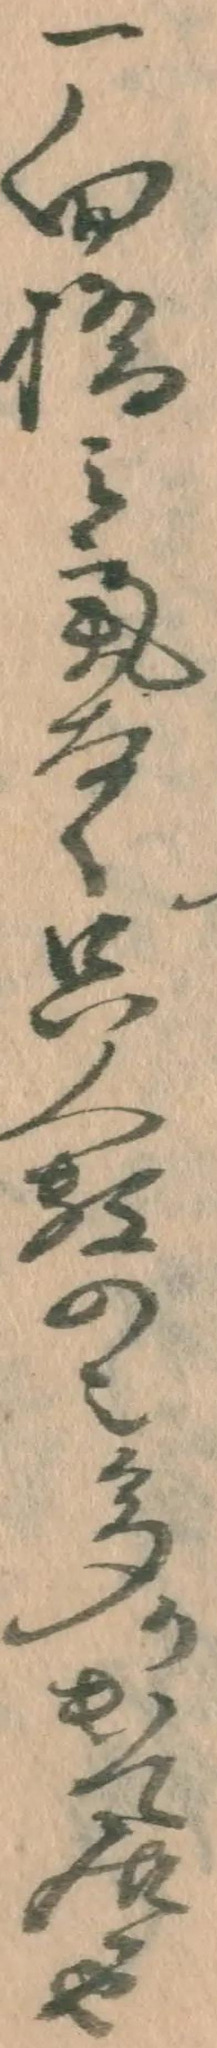一向橋之気なく只人数のみ多ク出て居候也
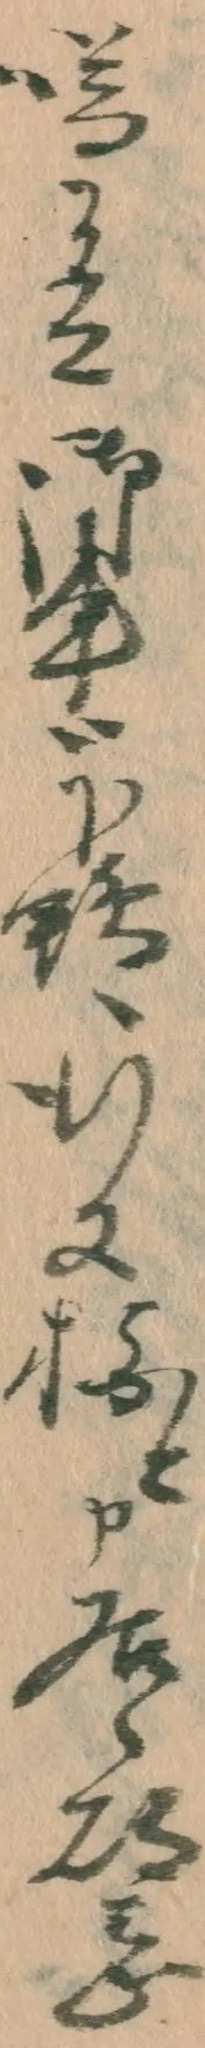噂には御車ハ下鴨へ行又と申居候故甚
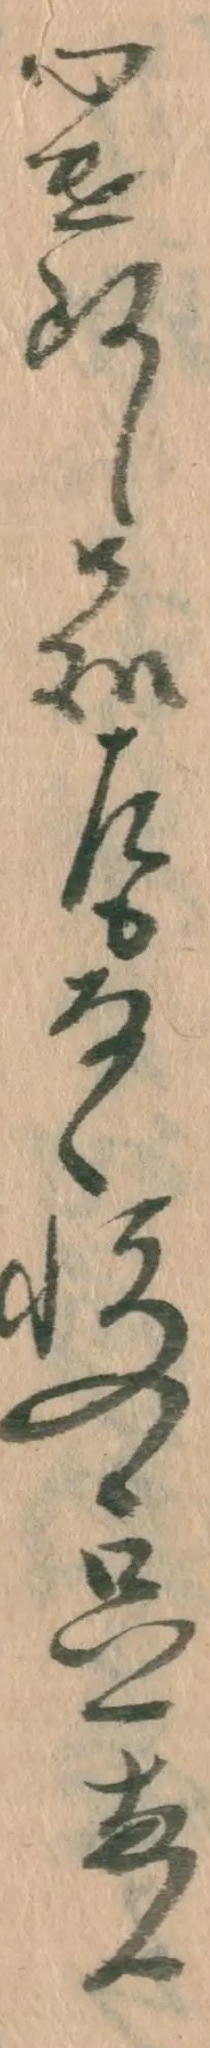心遣致し候処左もなく悦入候只一両日
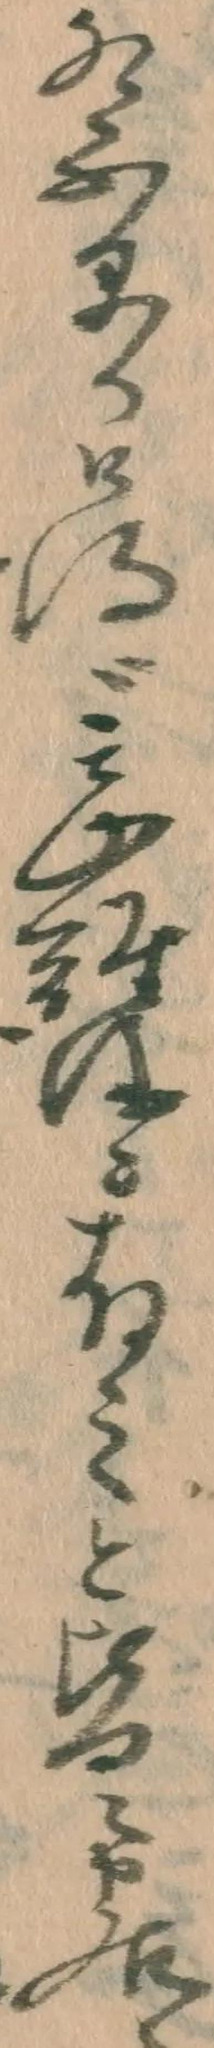祭早ク候得ハ甚難儀ニ有之と皆々申居候
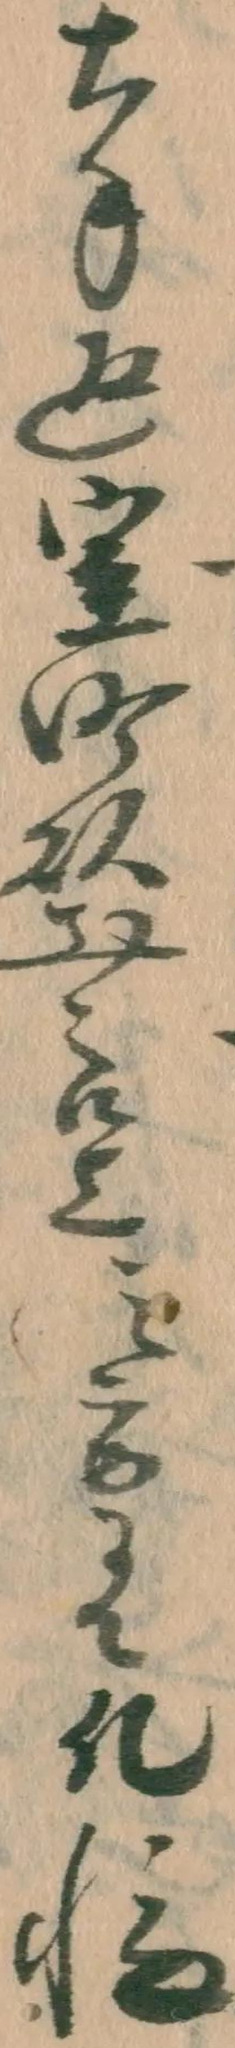土手通室町頭出上之方にて凡輪
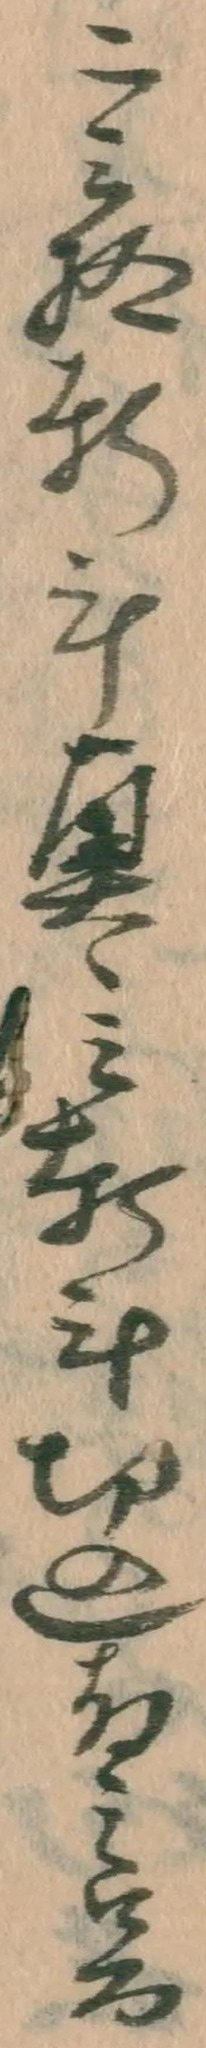二三拾軒計奥へ三軒斗切込有之候而
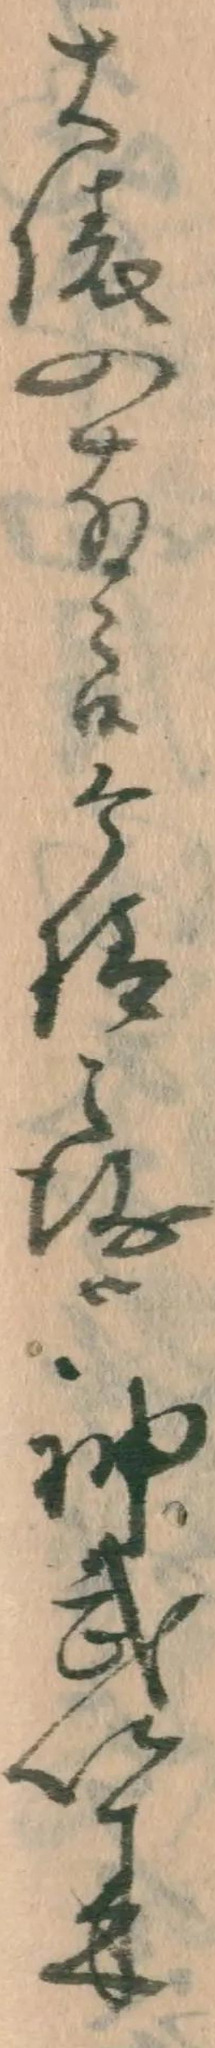大俵入有之候ケ様之儀ハ神武以来
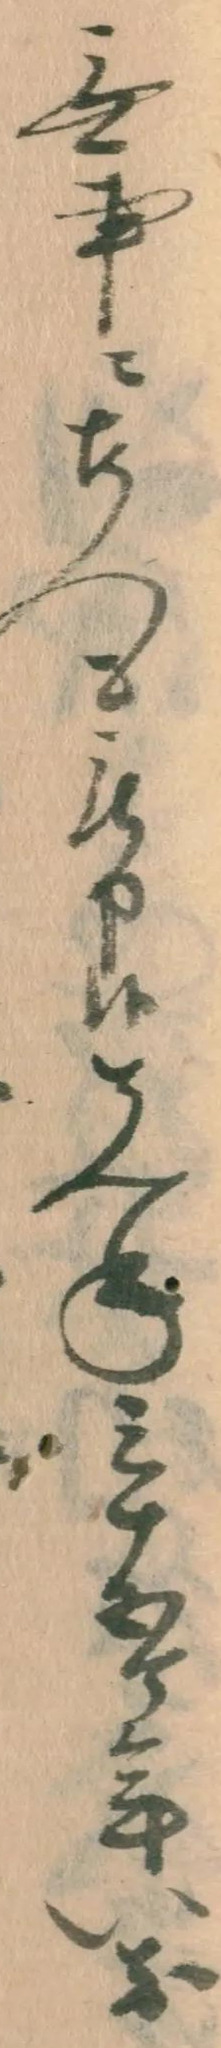無事ニ古人も被申候先年三十五ヶ年以前
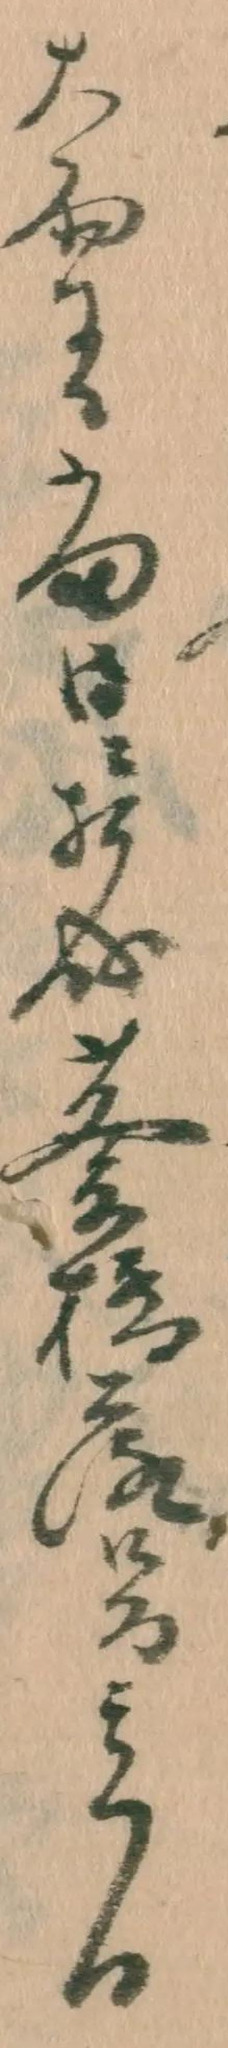大雨にて当日ニ相成葵橋落候而其日
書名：賀茂社記録. 第61冊
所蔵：国立国会図書館 National Diet Library, JAPAN
